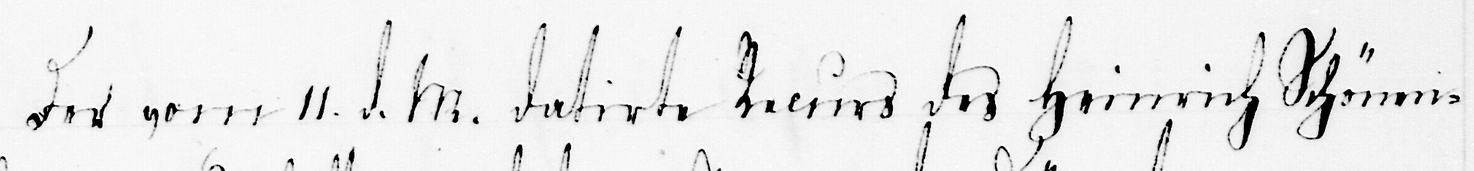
Der vom 11. d. M. datirte Recurs des Heinrich Schönen¬
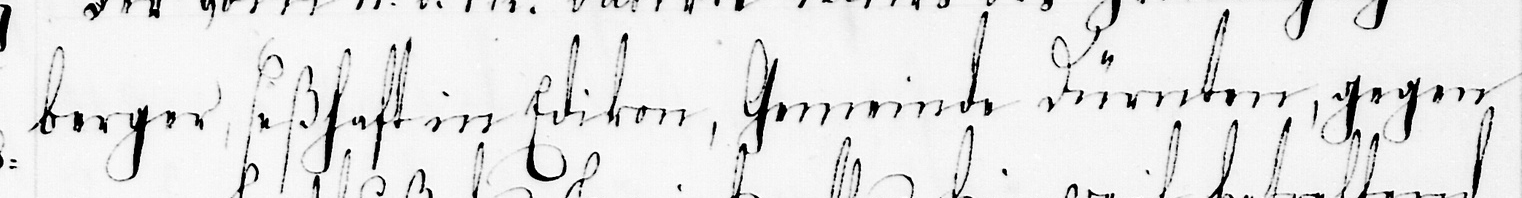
berger, seßhaft in Edikon, Gemeinde Dürnten, gegen
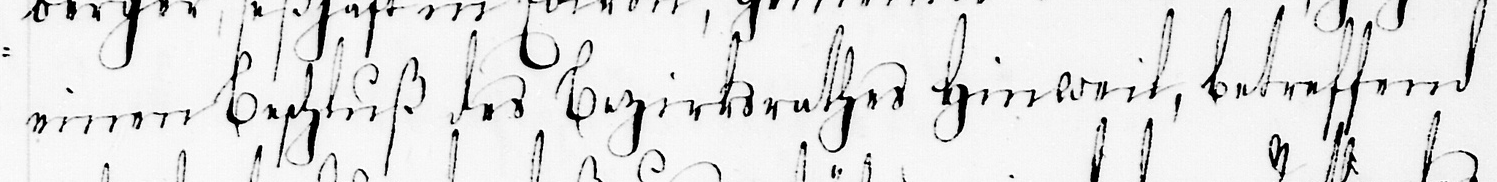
einen Beschluß des Bezirksrathes Hinweil, betreffend
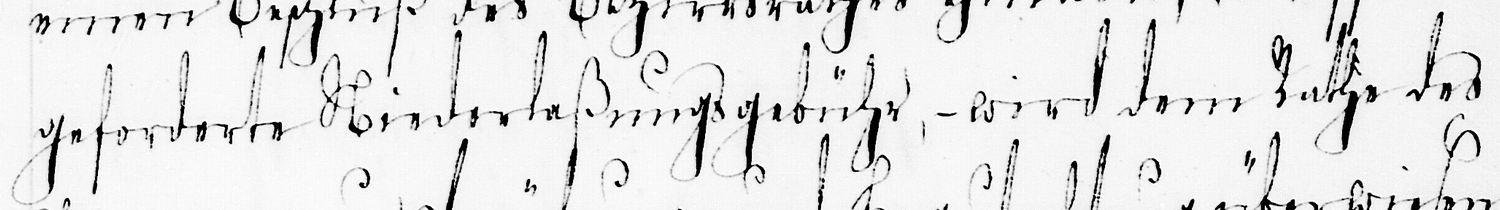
geforderte Niederlaßungsgebühr, – wird dem Rathe des
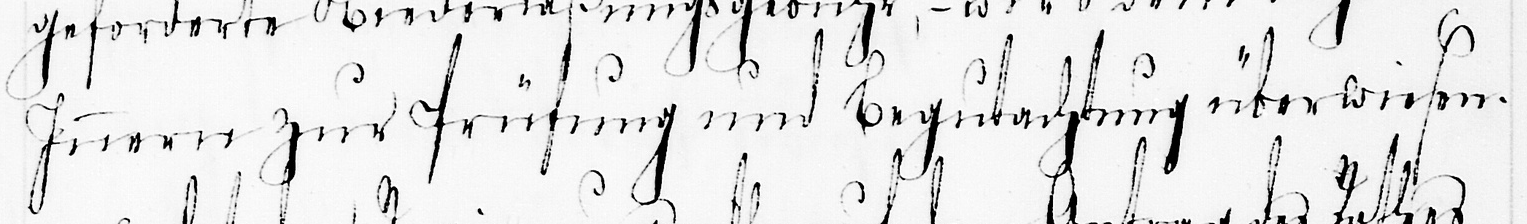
Innern zur Prüfung und Begutachtung überwiesen.
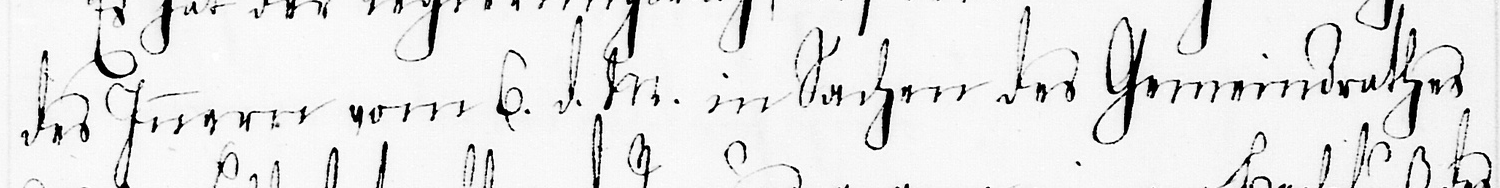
des Innern vom 6. d. M. in Sachen des Gemeindrathes
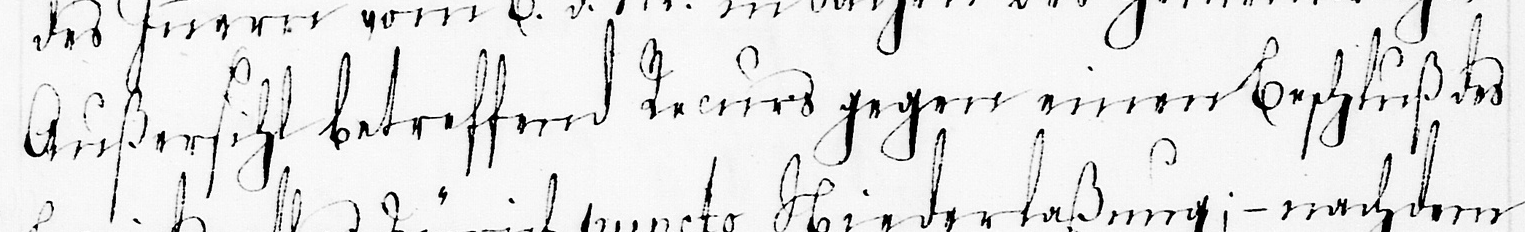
Außersihl betreffend Recurs gegen einen Beschluß des
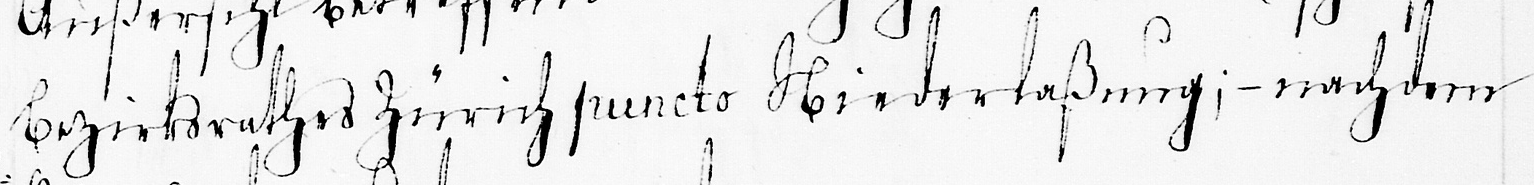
Bezirksrathes Zürich puncto Niederlaßung; – nachdem
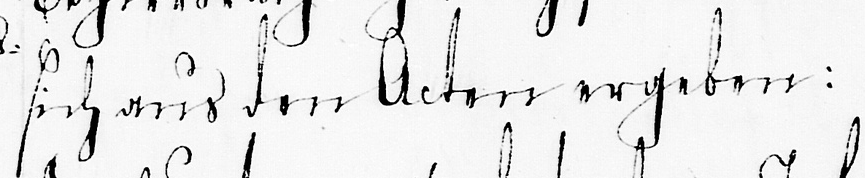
sich aus den Acten ergeben:
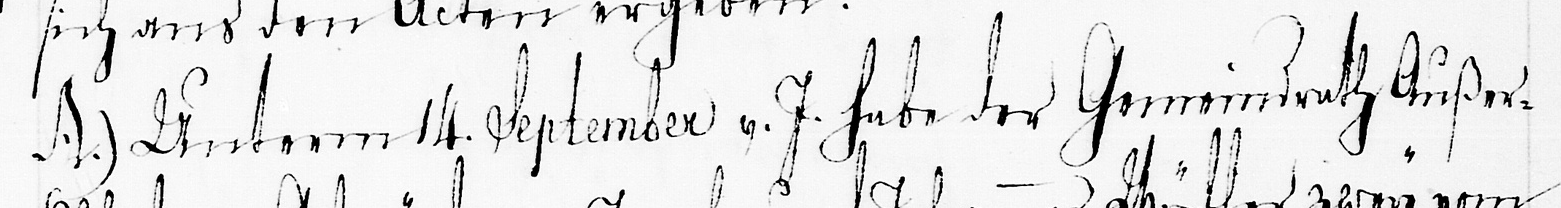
A.) Unterm 14. September v. J. habe der Gemeindrath Außer¬
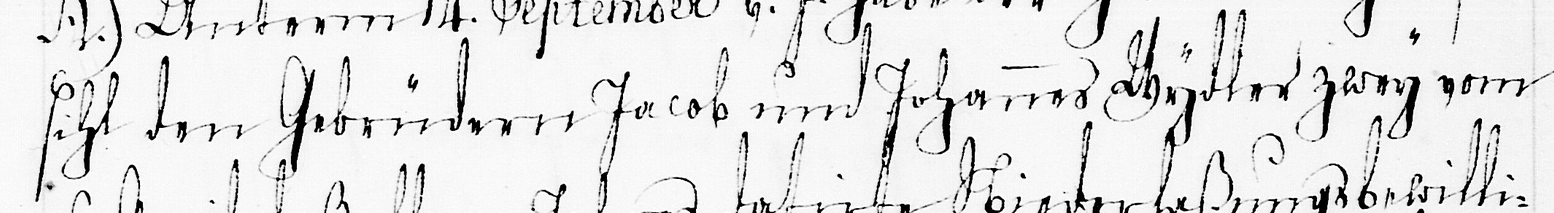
sihl den Gebrüdern Jacob und Johannes Wydler zwey vom
